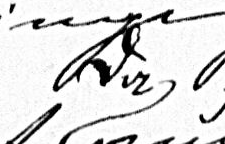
Da
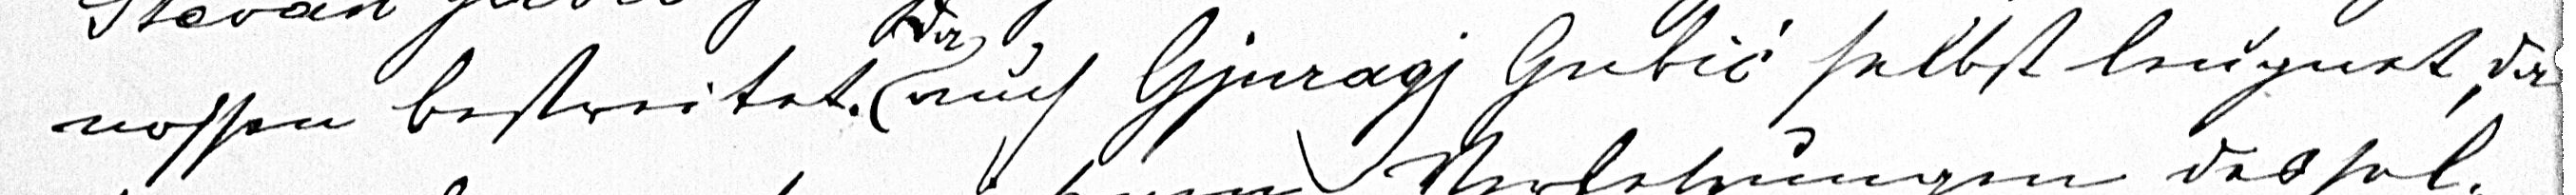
nossen bestreitet. auch Gjuragj Gubić selbst leugnet, da
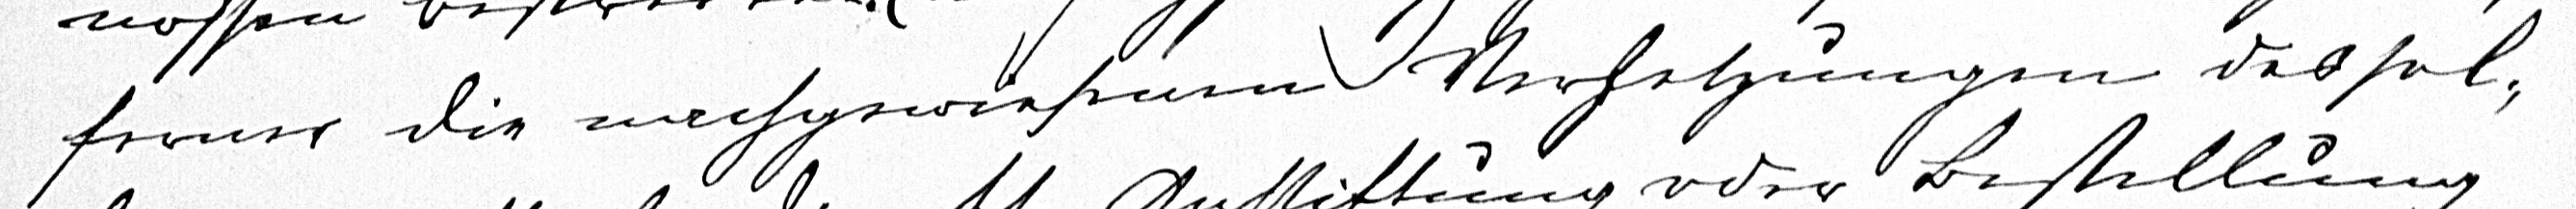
ferner die nachgewiesenen Verhetzungen dessel¬
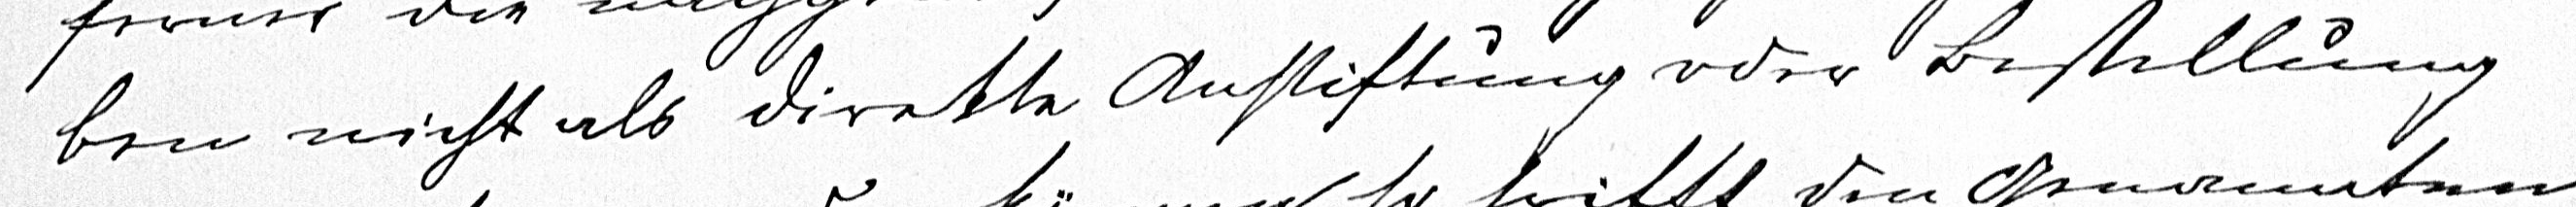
ben nicht als direkte Anstiftung oder Bestellung
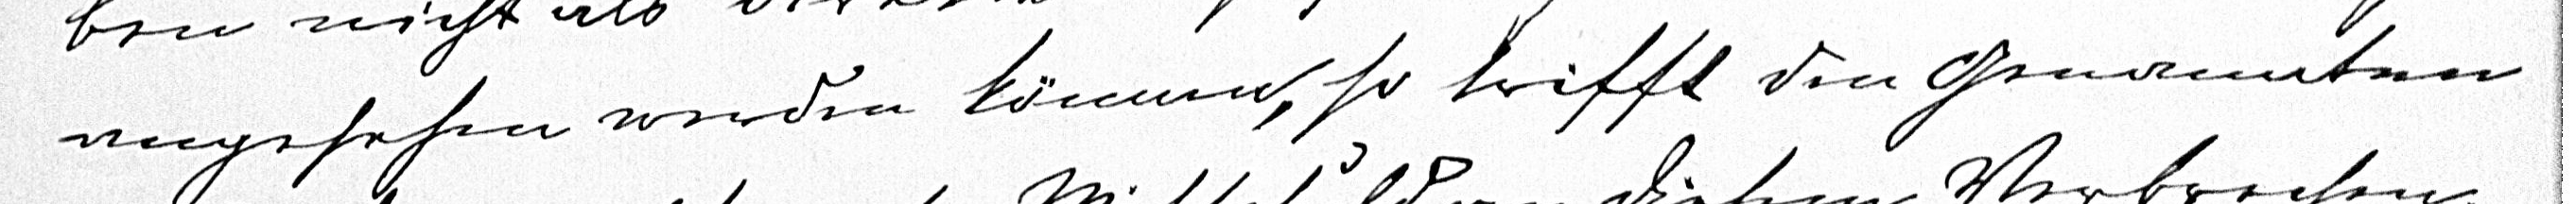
angesehen werden können, so trifft den Genannten
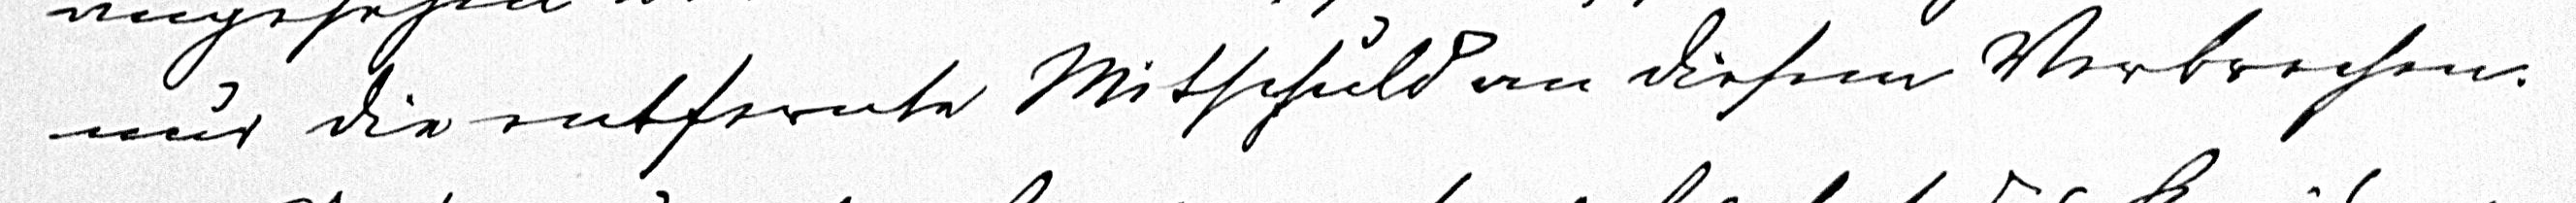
nur die entfernte Mitschuld an diesem Verbrechen.
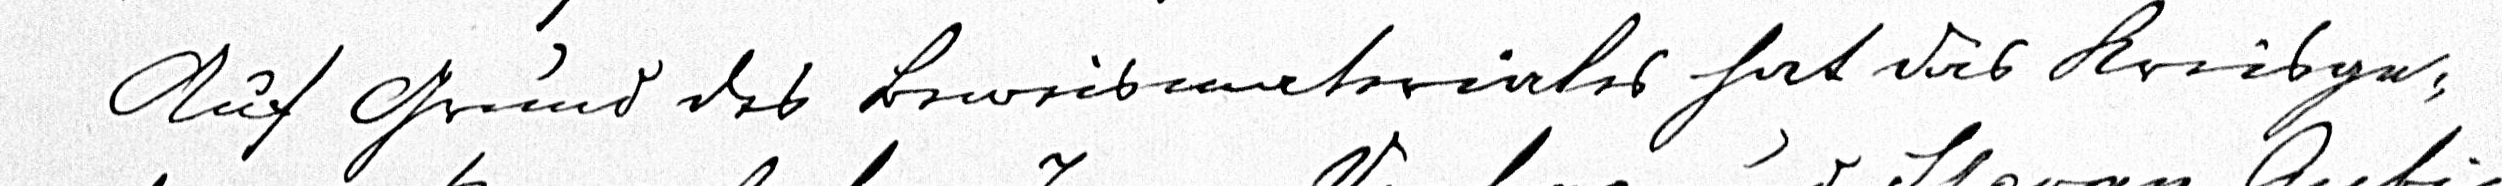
Auf Grund des Beweismateriales hat das Kreisge¬
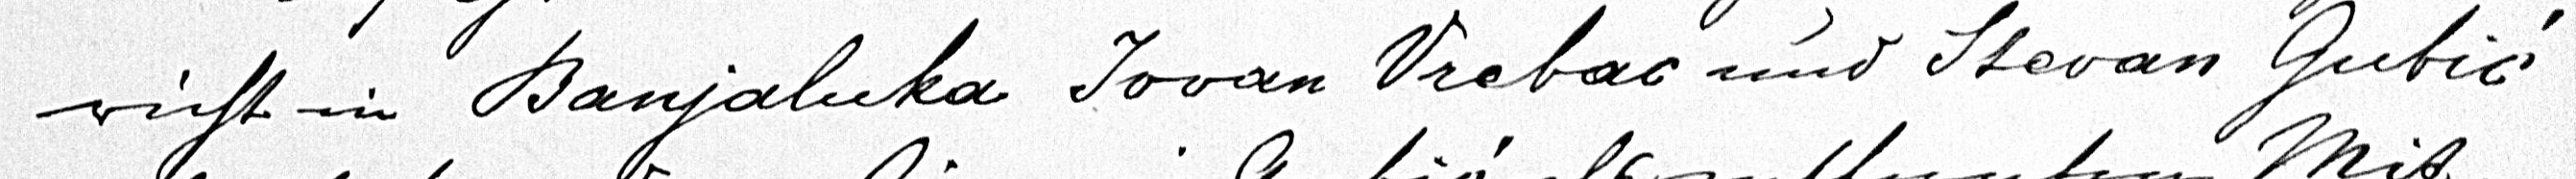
richt in Banjaluka Jovan Vrebac und Stevan Gubić
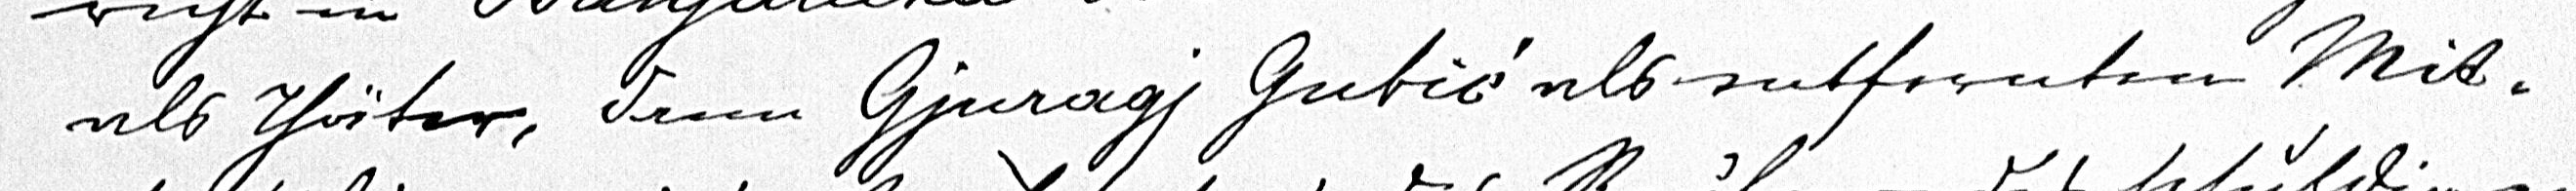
als Thäter, dann Gjuragj Gubić als entfernten Mit¬
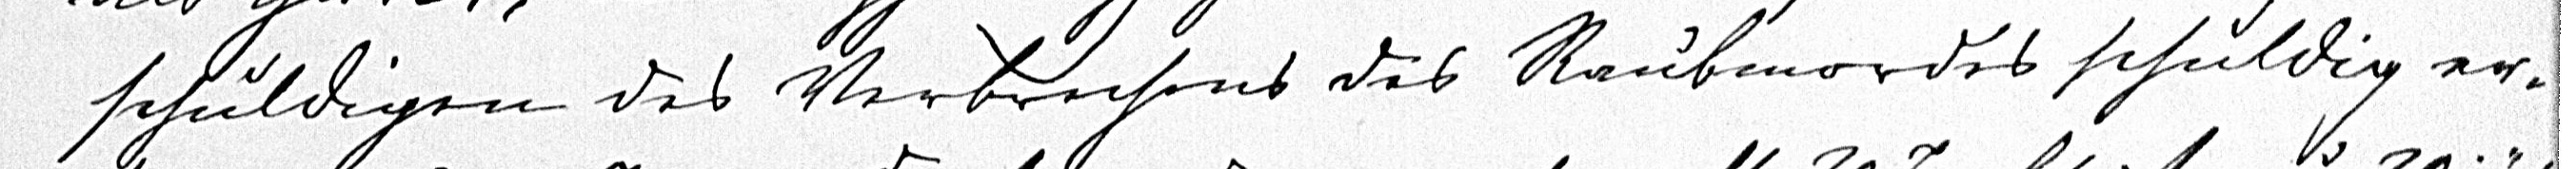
schuldigen des Verbrechens des Raubmordes schuldig er¬
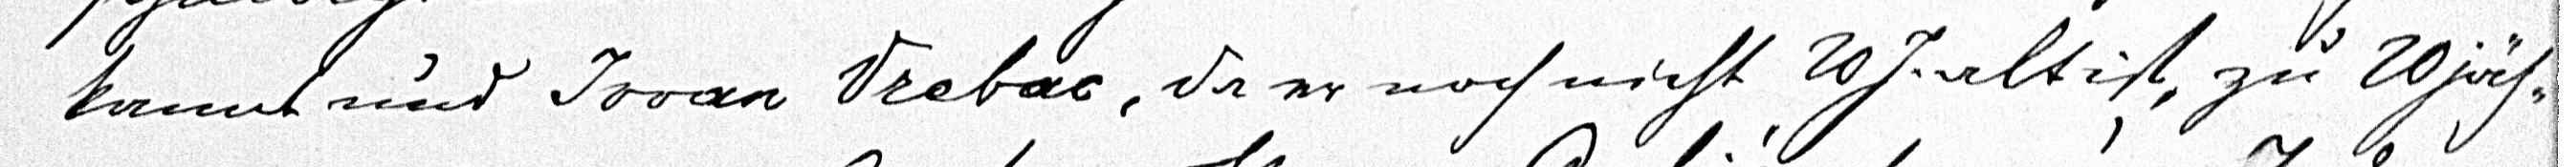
kannt und Jovan Vrebac, da er noch nicht 20 J. alt ist, zu 20jäh¬
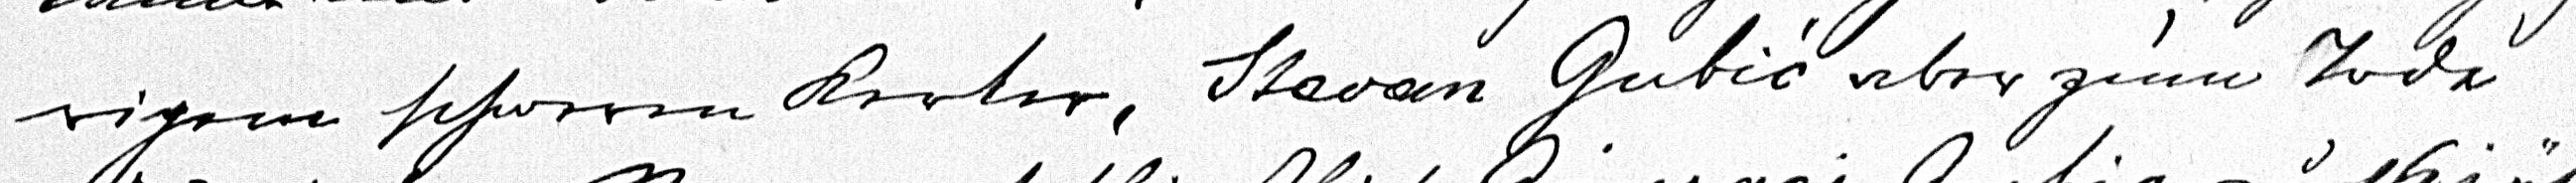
rigern schweren Kerker, Stevan Gubić aber zum Tode
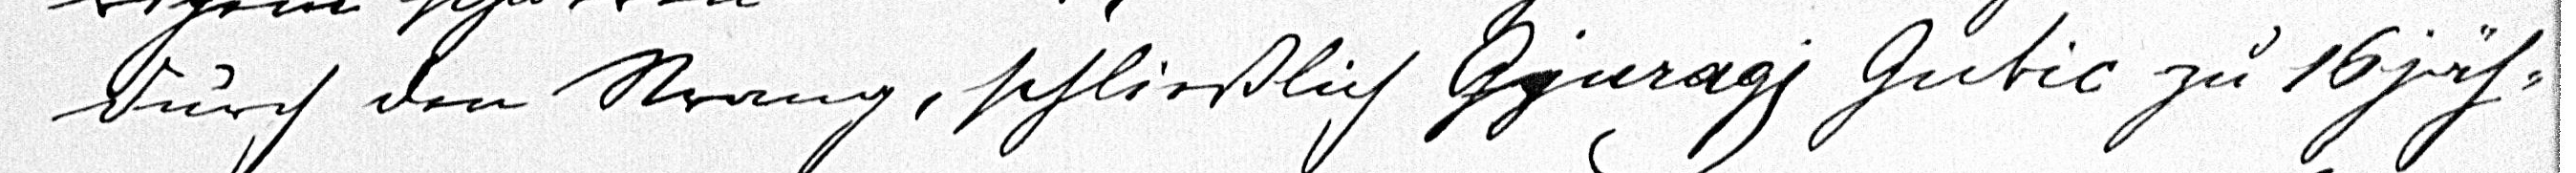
durch den Strang, schließlich Gjuragj Gubic zu 16jäh¬
